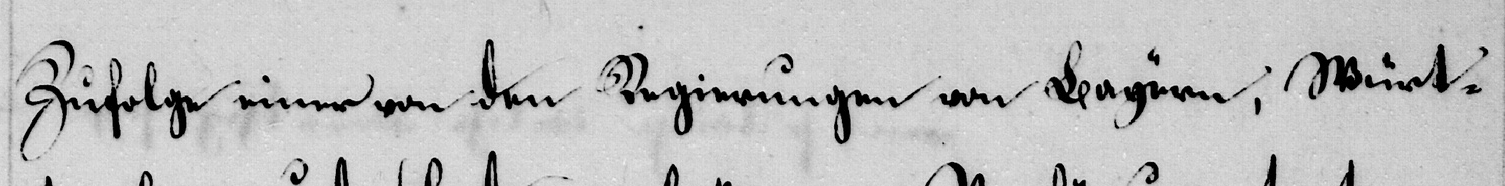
Zufolge einer von den Regierungen von Bayern, Würt¬
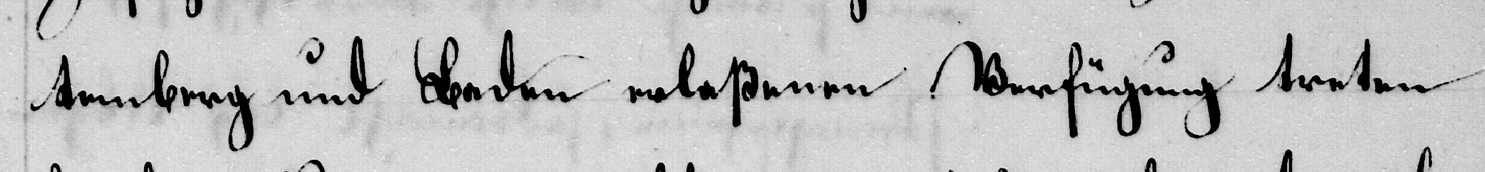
temberg und Baden erlaßenen Verfügung treten
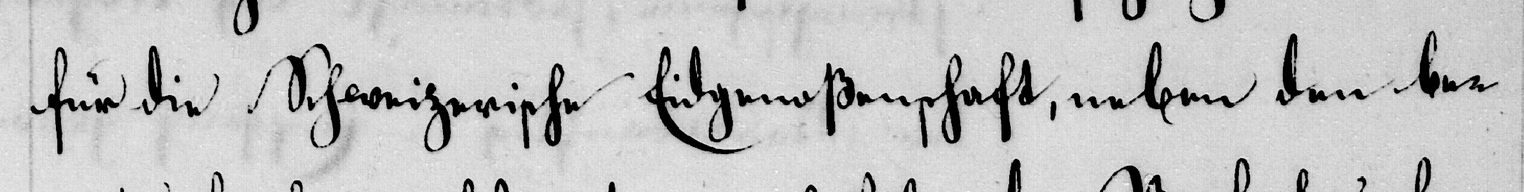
für die Schweizerische Eidgenoßenschaft, neben den be¬
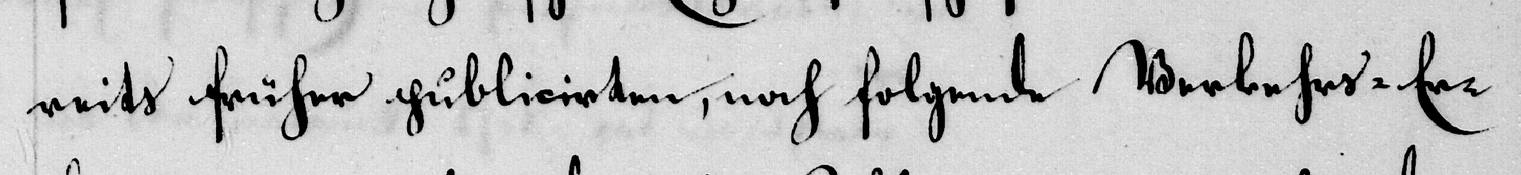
reits früher publicirten, noch folgende Verkehrs-Er¬
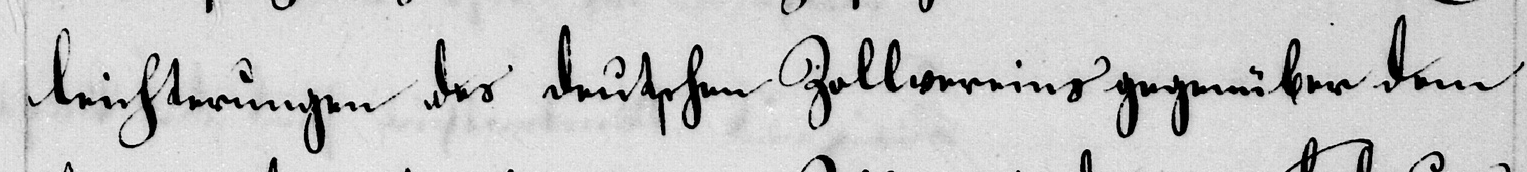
leichterungen des deutschen Zollvereins gegenüber dem
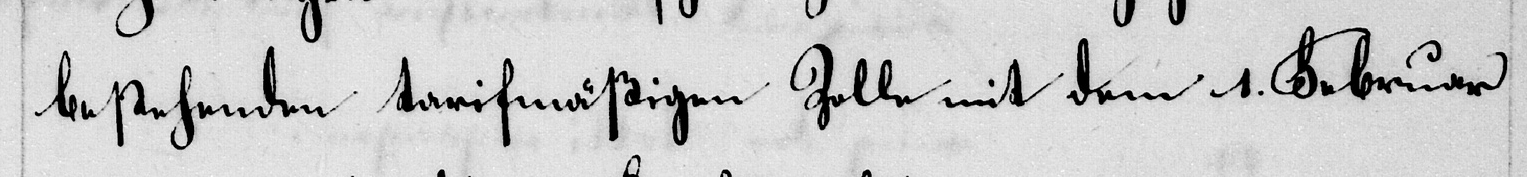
bestehenden tarifmäßigen Zolle mit dem 1. Februar
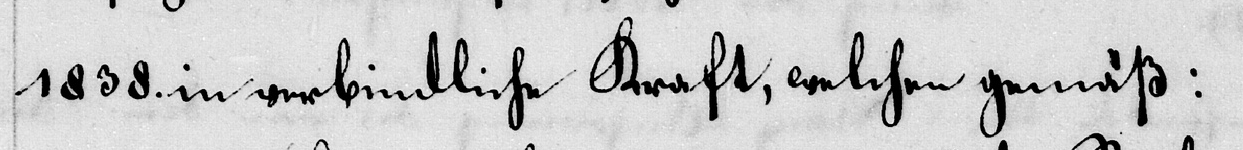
1838. in verbindliche Kraft, welchen gemäß:
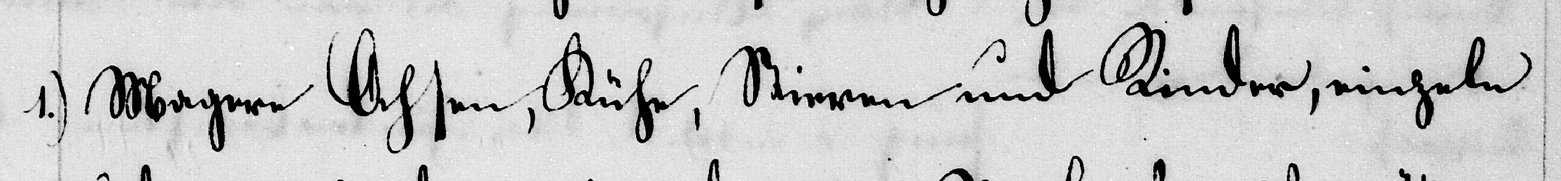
1.) Magere Ochsen, Kühe, Stieren und Rinder, einzeln
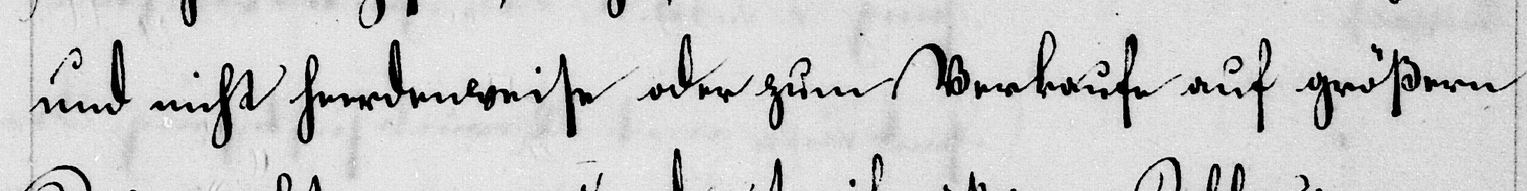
und nicht herdenweise oder zum Verkaufe auf größeren
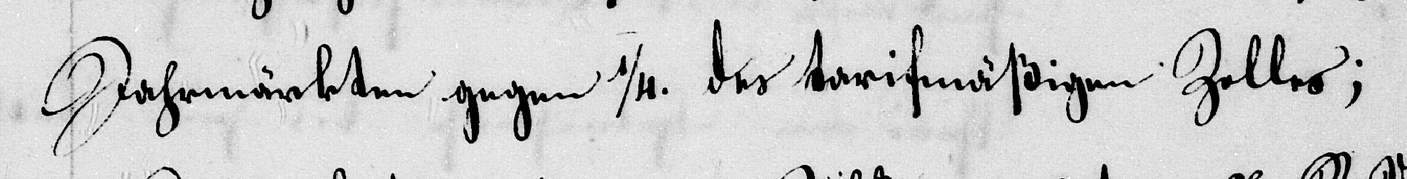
Jahrmärkten gegen 1/4. des tarifmäßigen Zolles;
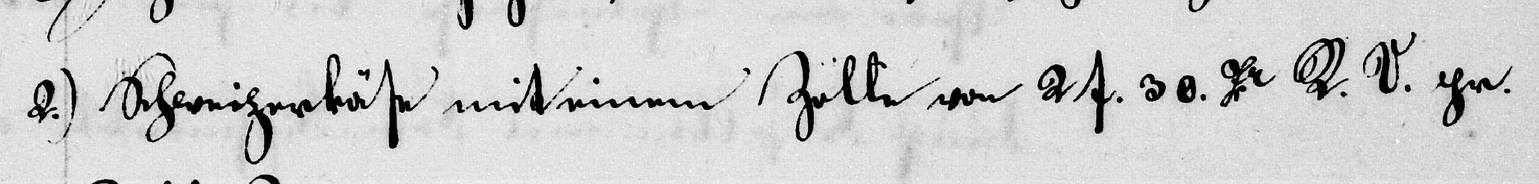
2.) Schweizerkäse mit einem Zolle von 2. f. 30. Xr. R. V. pr.
